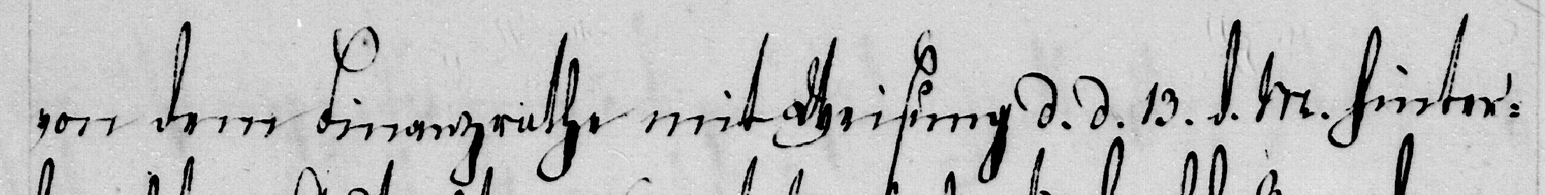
von dem Finanzrathe mit Weisung d. d. 13. d. M. hinter¬
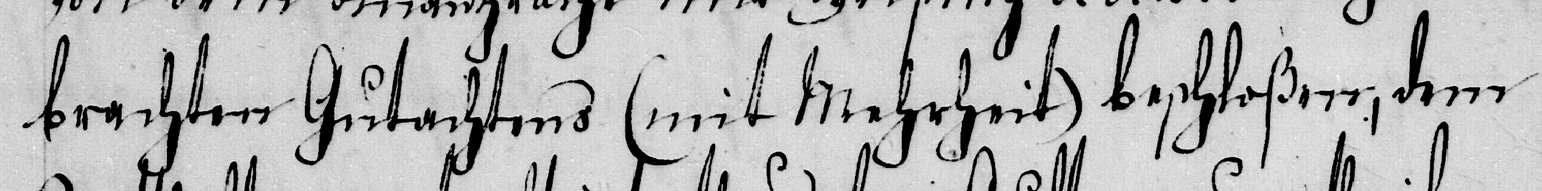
brachten Gutachtens (mit Mehrheit) beschloßen, dem
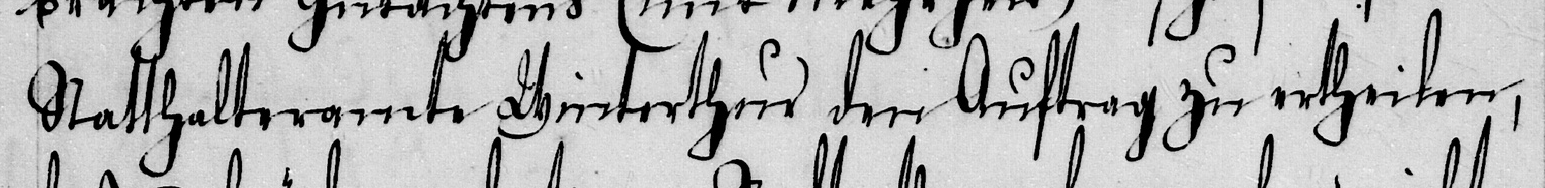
Statthalteramte Winterthur den Auftrag zu ertheilen,
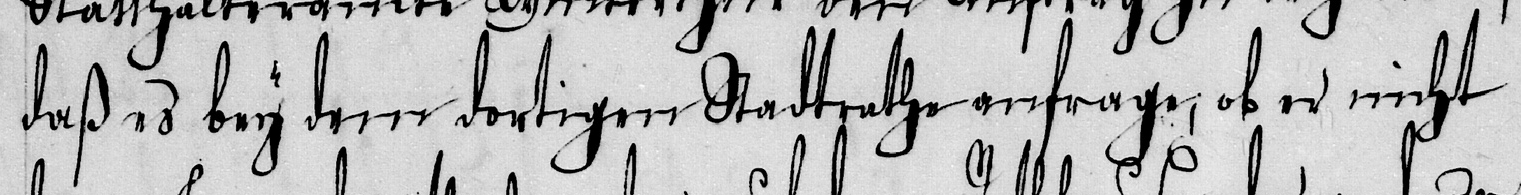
daß es bey dem dortigen Stadtrathe anfrage, ob er nicht
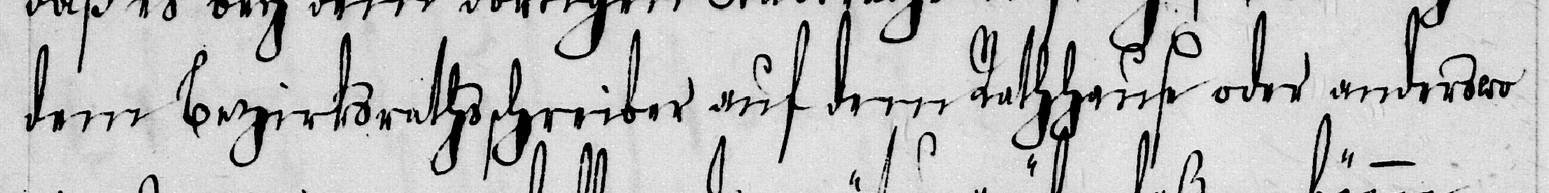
dem Bezirksrathsschreiber auf dem Rathhause oder anderswo
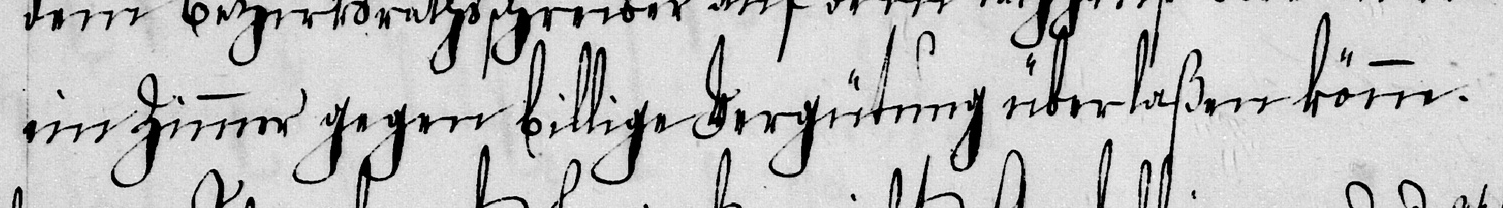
ein Zimmer gegen billige Vergütung überlaßen könne.
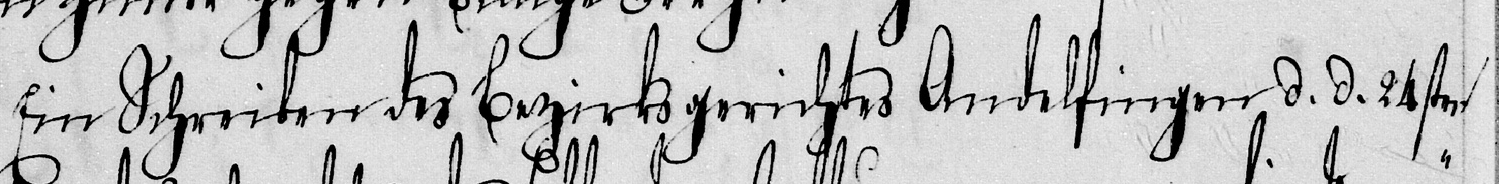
Ein Schreiben des Bezirksgerichtes Andelfingen d. d. 24sten
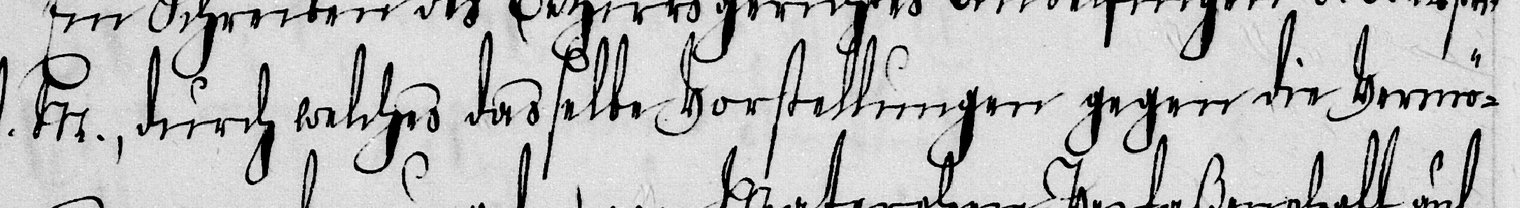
M., durch welches dasselbe Vorstellungen gegen die Vermö¬
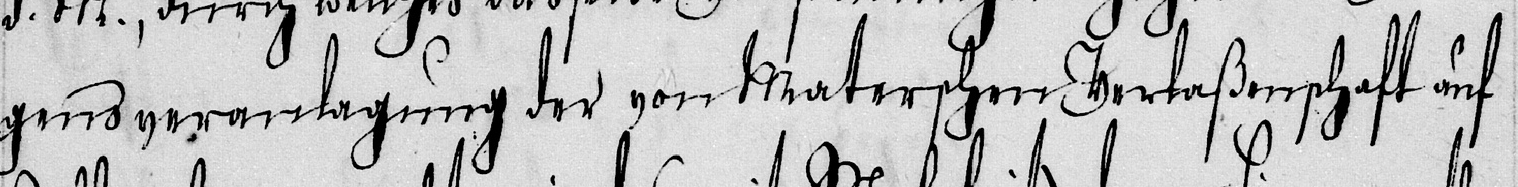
gensveranlagung der von Materschen Verlaßenschaft auf
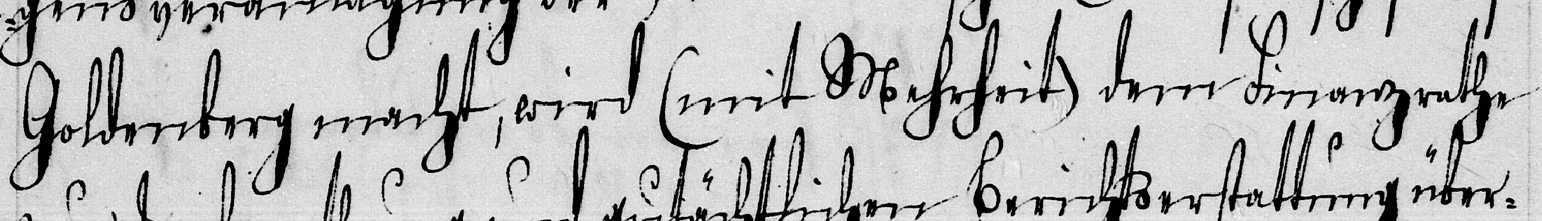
Goldenberg macht, wird (mit Mehrheit) dem Finanzrathe
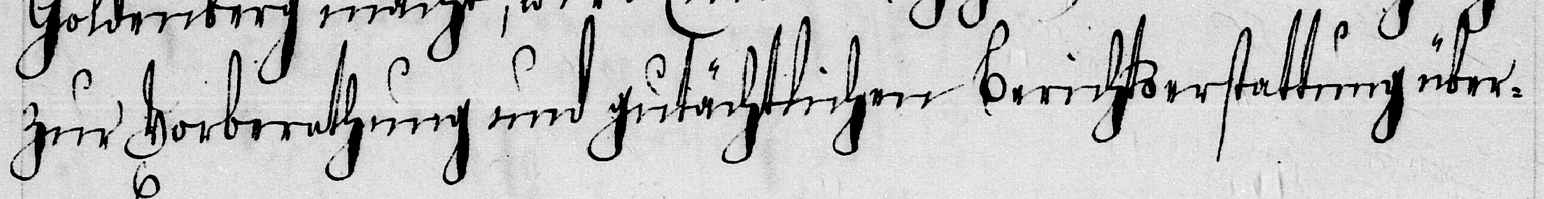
zur Vorberathung und gutächtlichen Berichtserstattung über¬
